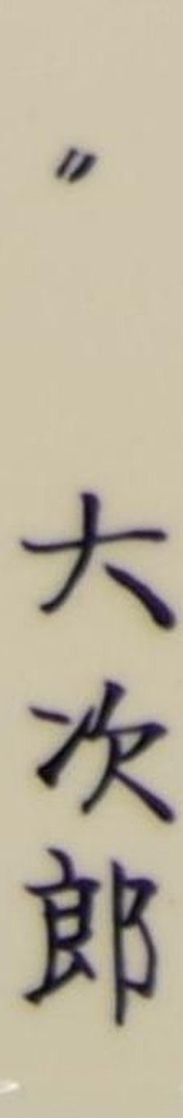大次郎
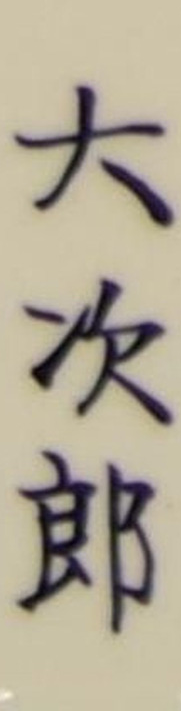大次郎
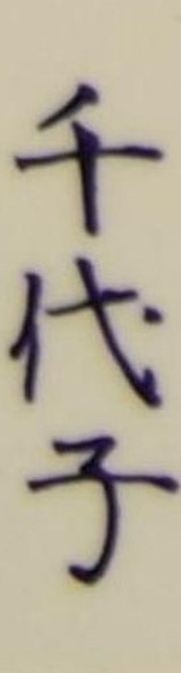千代子
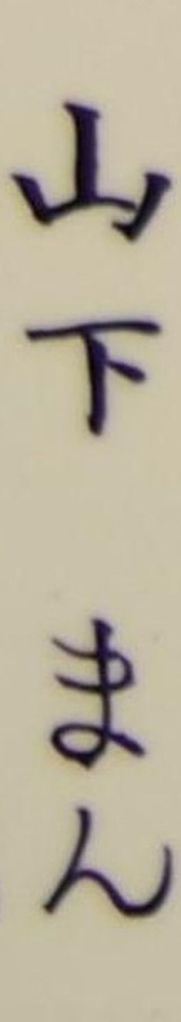山下まん
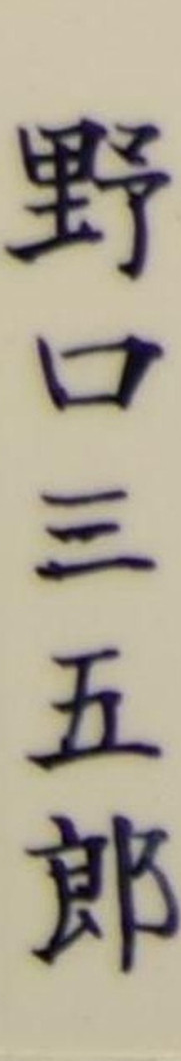野口三五郎

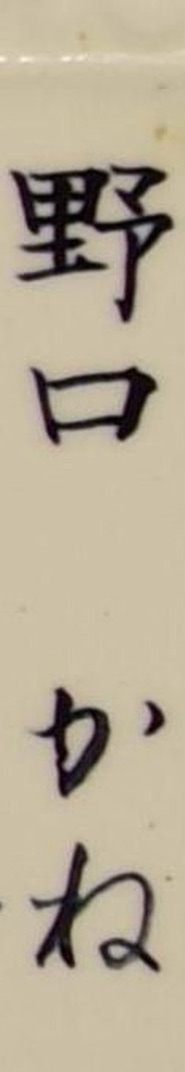野口かね
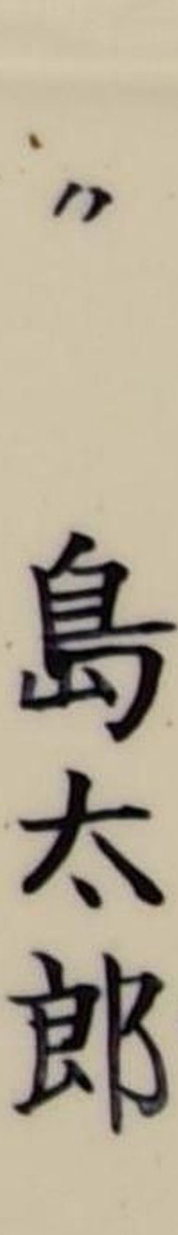島太郎
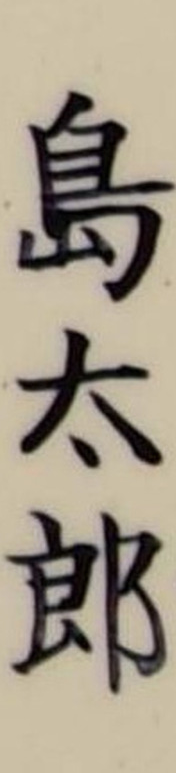島太郎
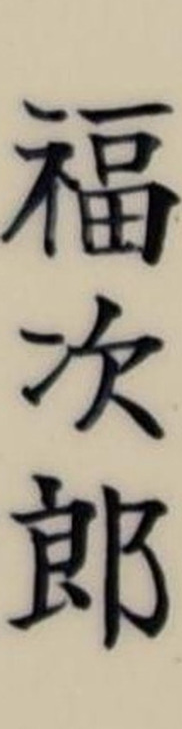福次郎
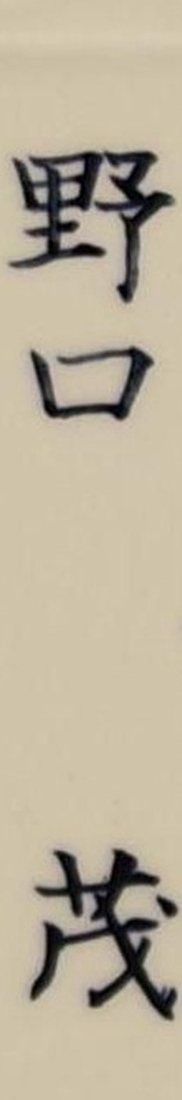野口茂
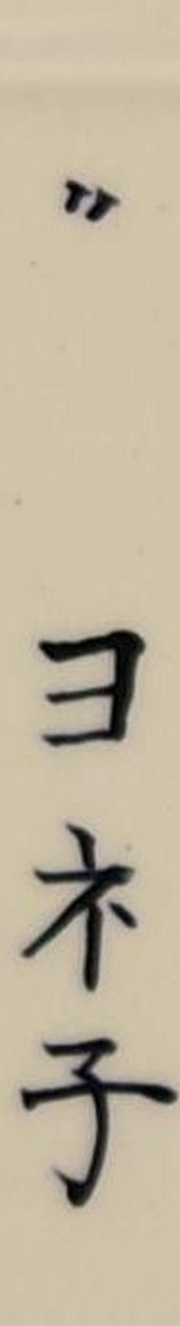ヨネ子
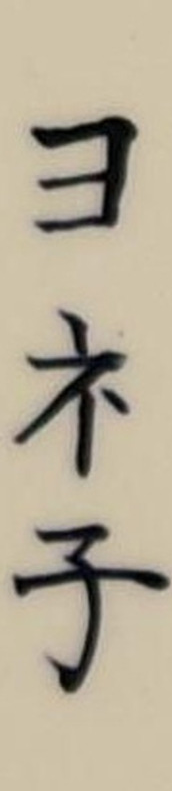ヨネ子
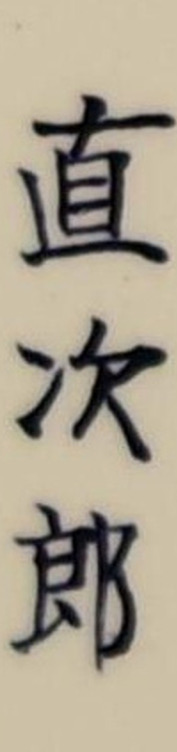直次郎
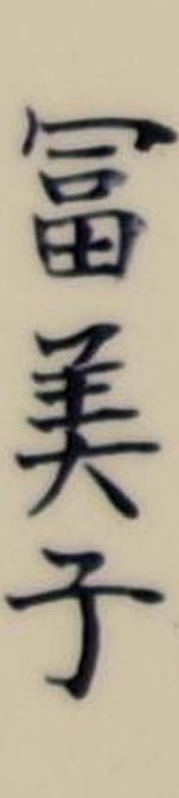冨美子
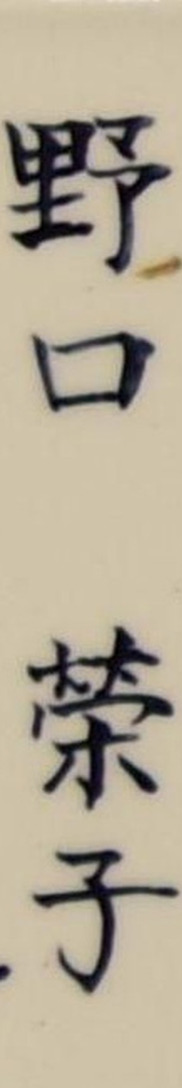野口榮子
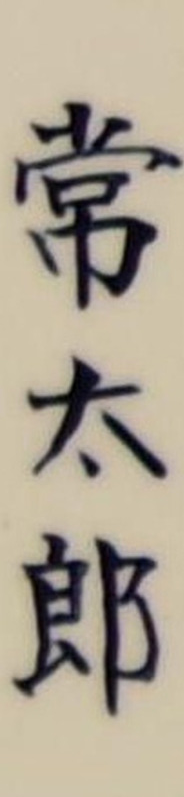常太郎
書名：A~D
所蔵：koyasan kongobuji
